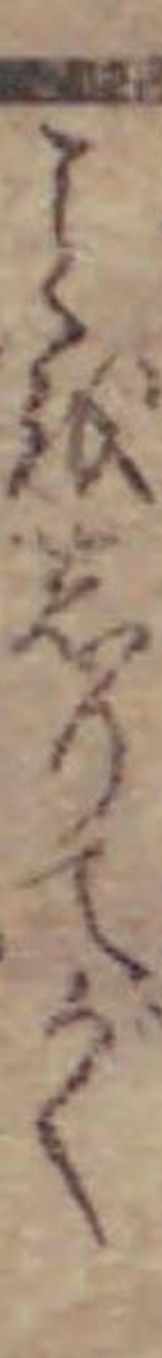ことをしりてがく
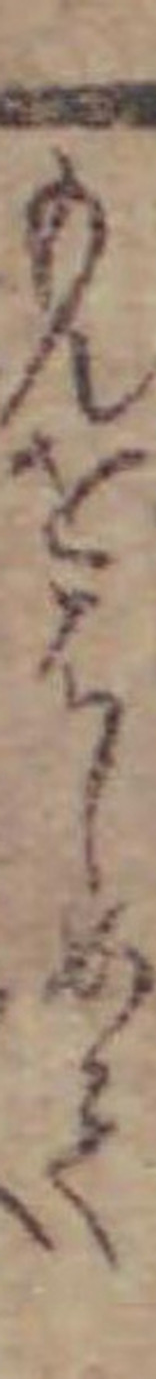もんをはしめて
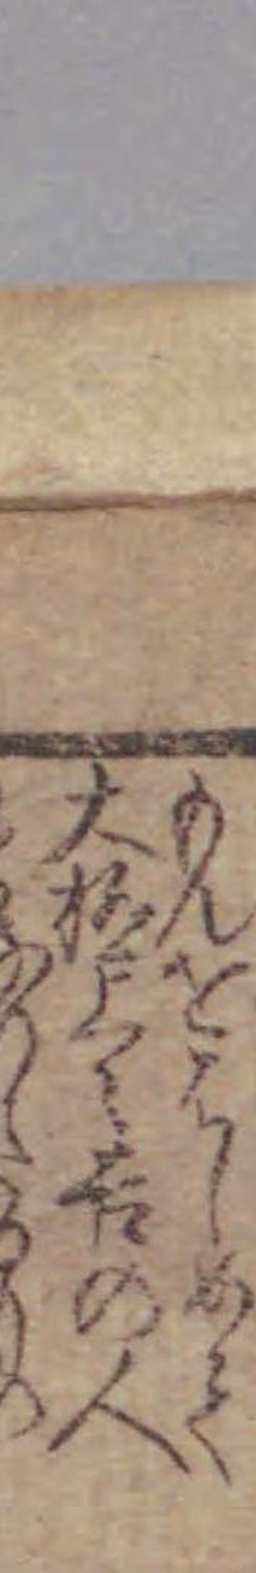大極上々吉の人
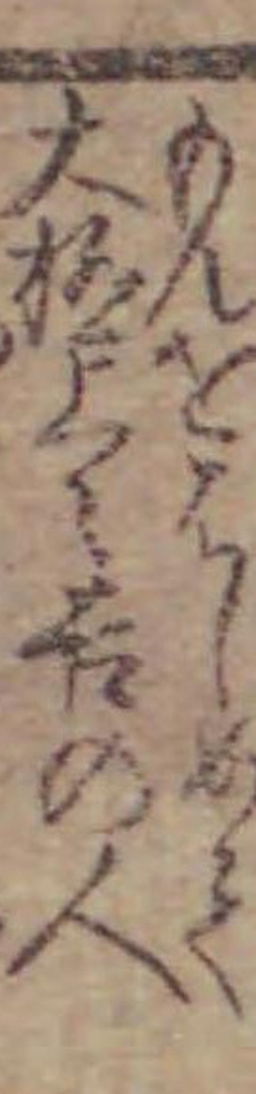大極上々吉の人
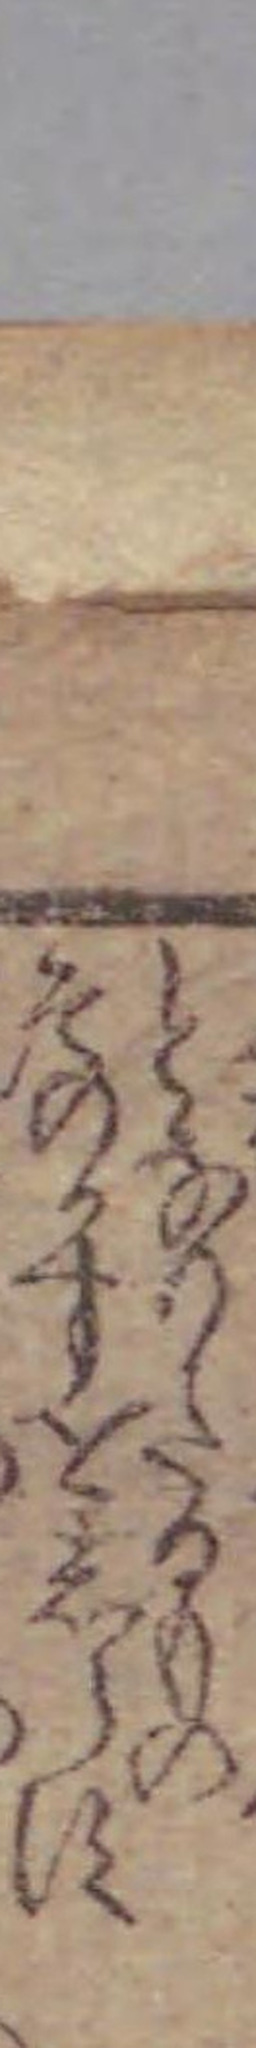そのかすをしらす
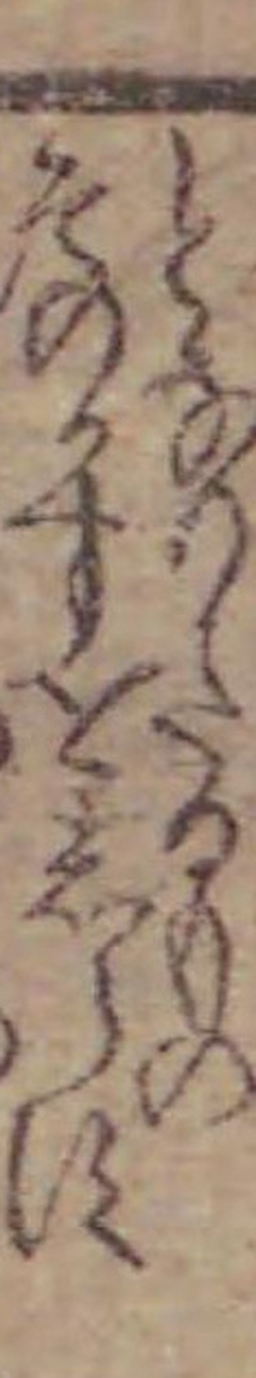そのかすをしらす
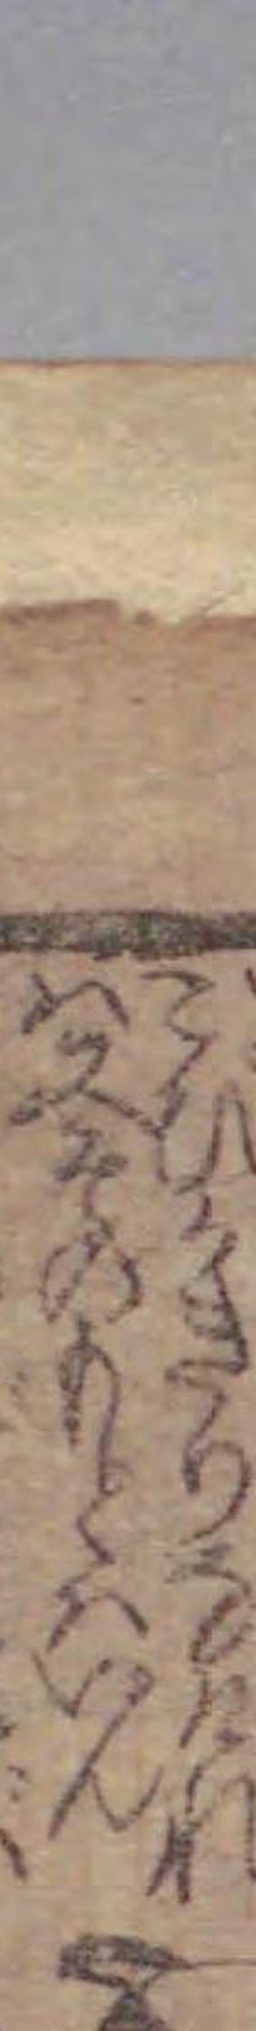は又そのもとはいん
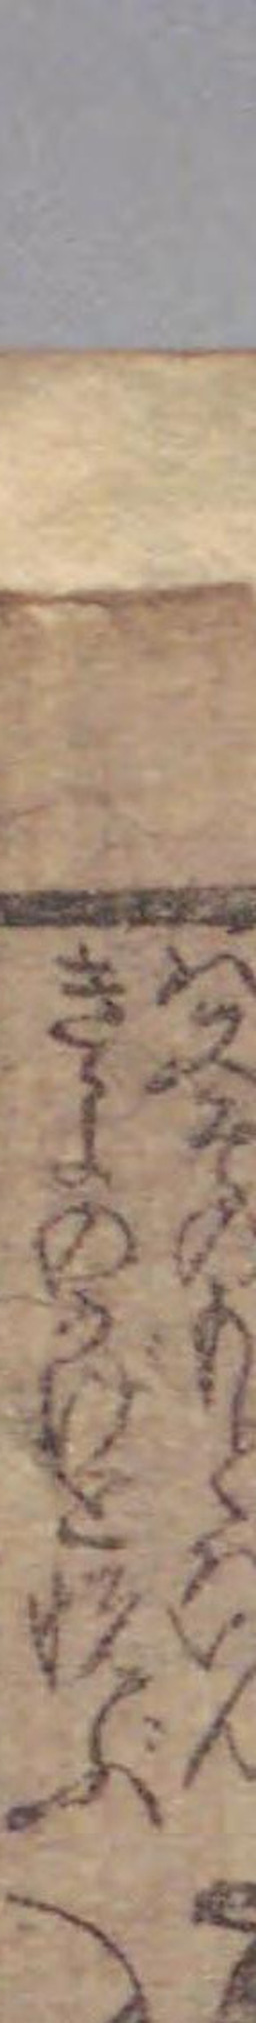きよのかげを悦ぶ

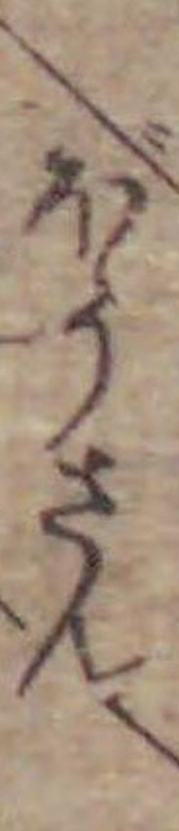ぼうさん
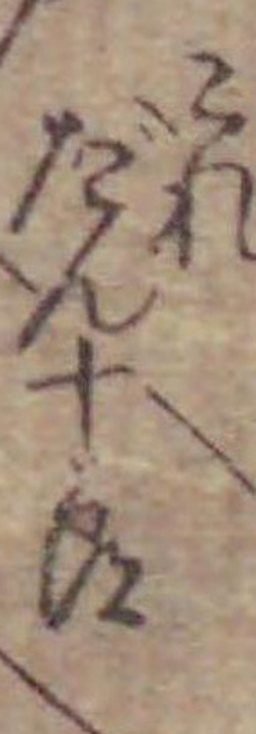だん十郎
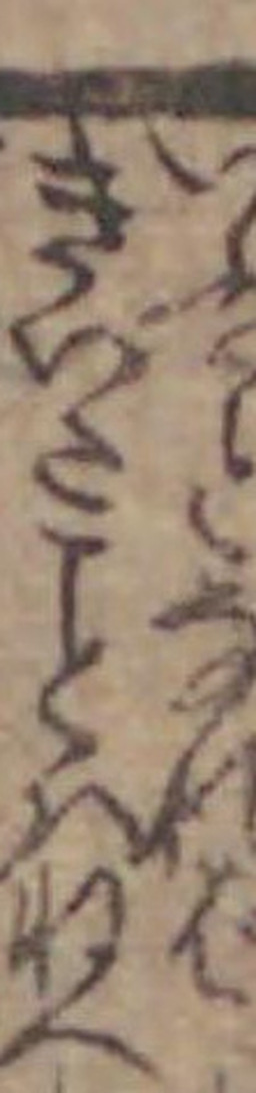きいたことはねへ
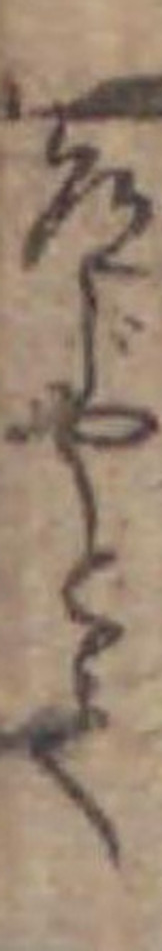道じやとて
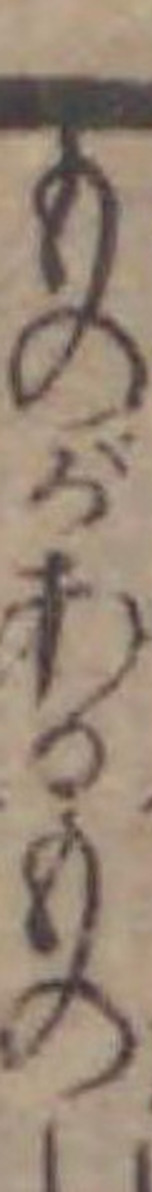ものがあるもの
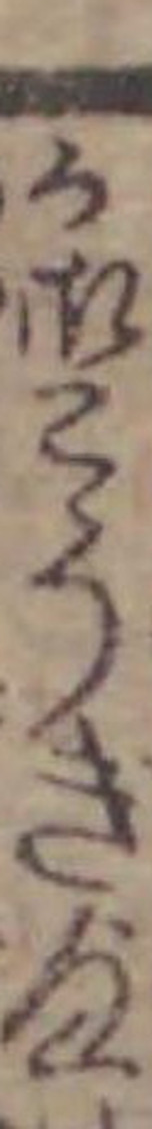か御こうぎさま
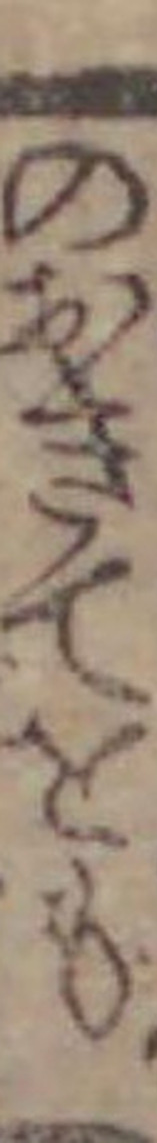のおきてをも
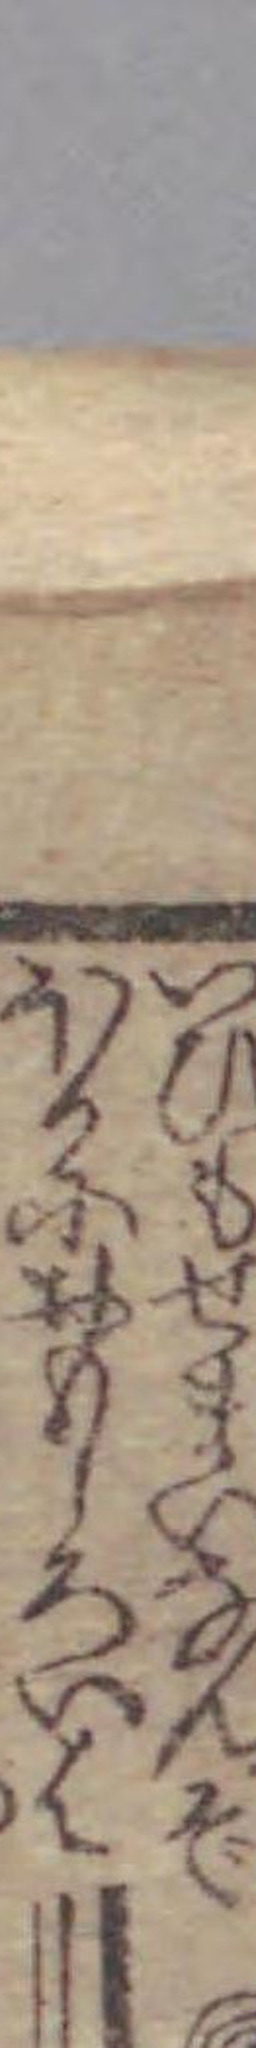ほかにおもしろいは
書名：即席耳学問 : 3巻
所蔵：国立国会図書館 National Diet Library, JAPAN
